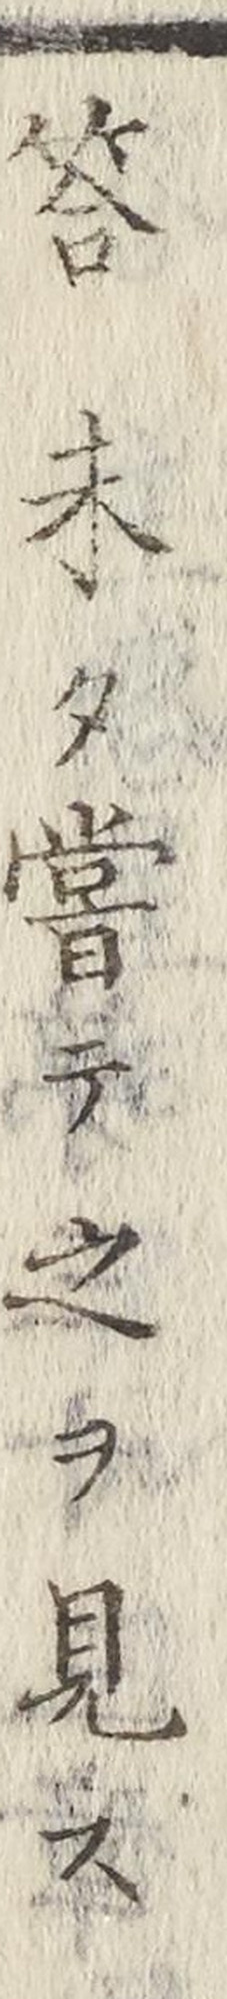答未タ嘗テ之ヲ見ス
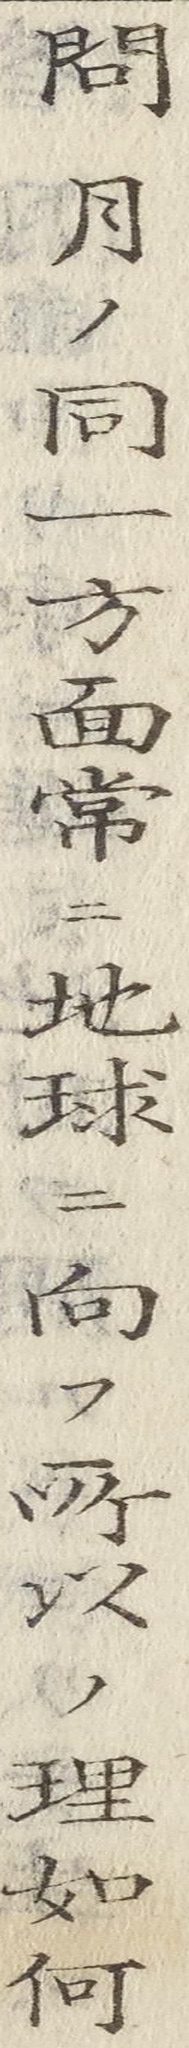問月ノ同一方面常ニ地球ニ向フ所以ノ理如何
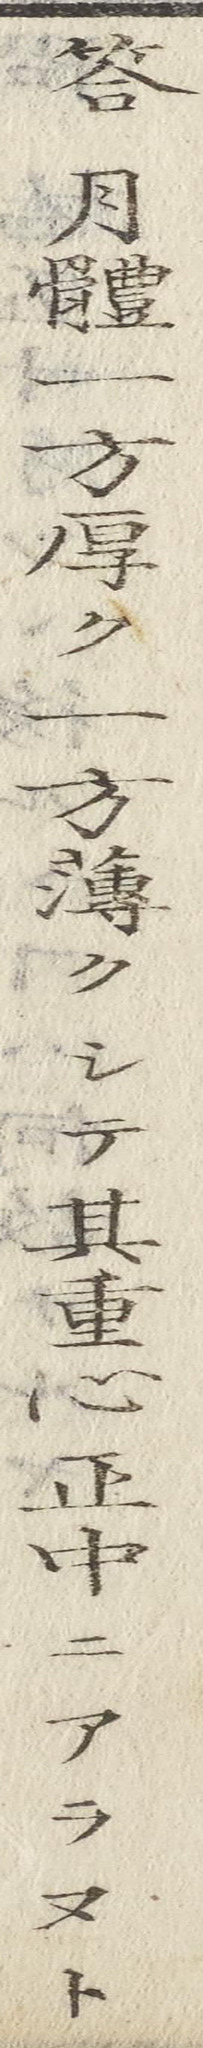答月体一方厚ク一方薄クシテ其重心正中ニアラヌト
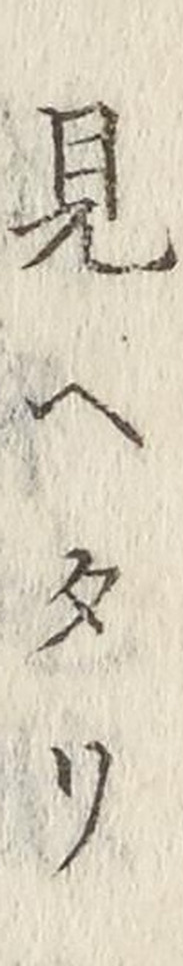見ヘタリ
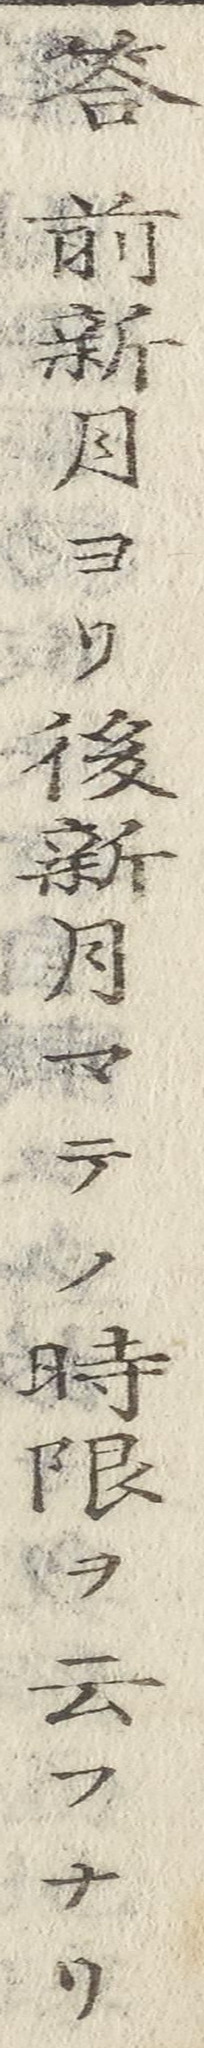答前新月ヨリ後新月マテノ時限ヲ云フナリ
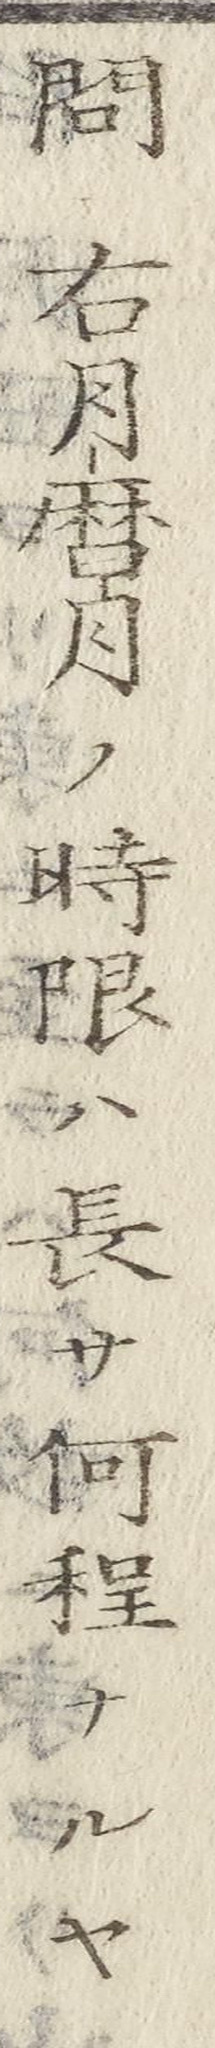問右月-暦-月ノ時限ハ長サ何程ナルヤ
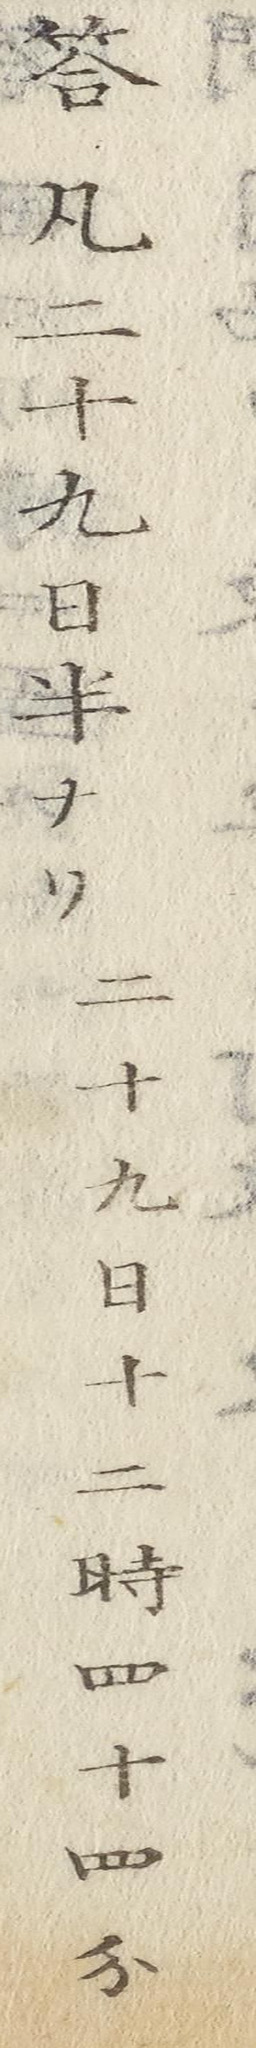答凡二十九日半ナリ二十九日十二時四十四分
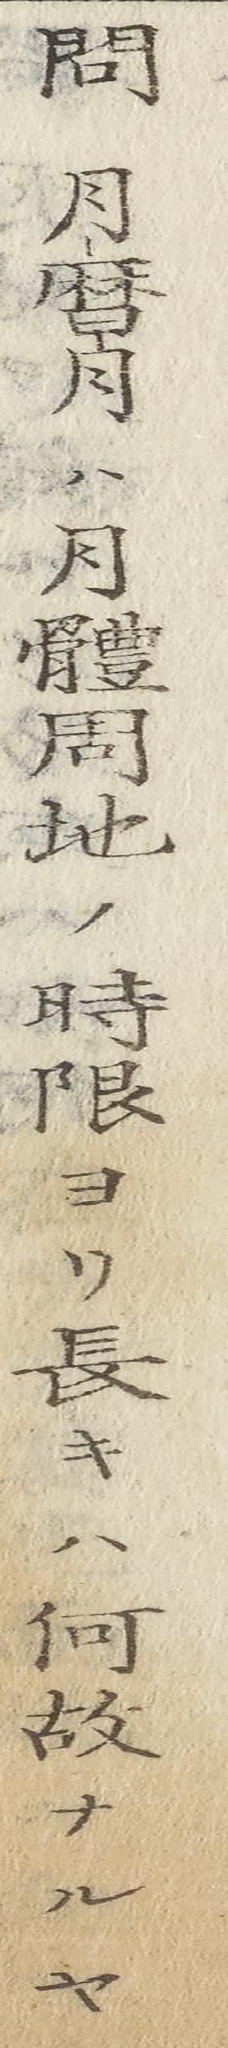問月-暦-月ハ月体周地ノ時限ヨリ長キハ何故ナルヤ
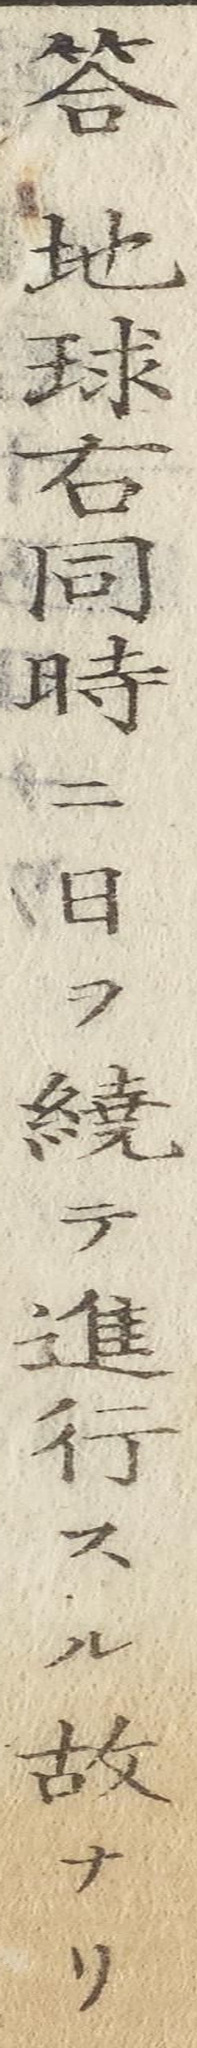答地球右同時ニ日ヲ繞テ進行スル故ナリ
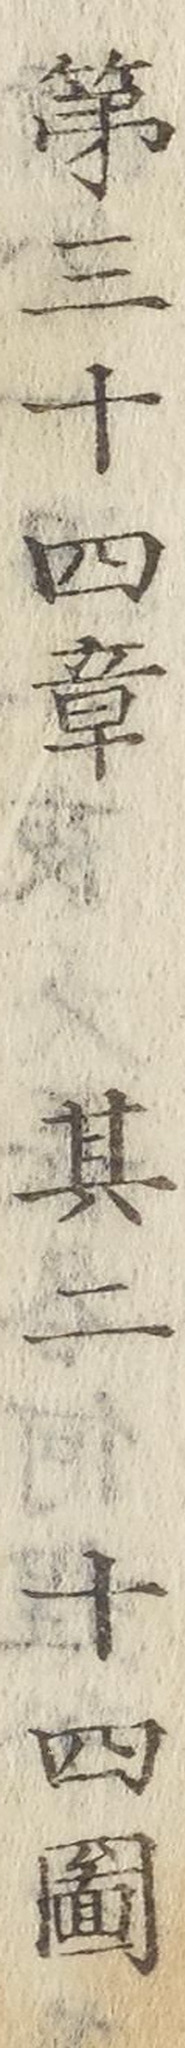第三十四章其二十四図

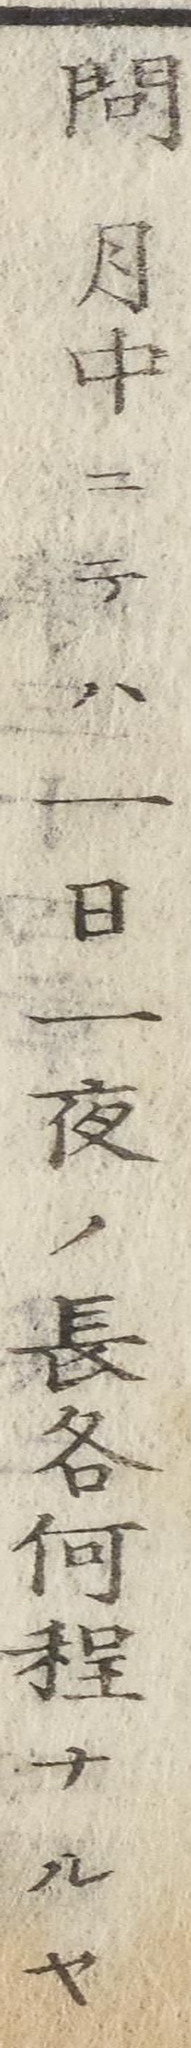問月中ニテハ一日一夜ノ長各何程ナルヤ
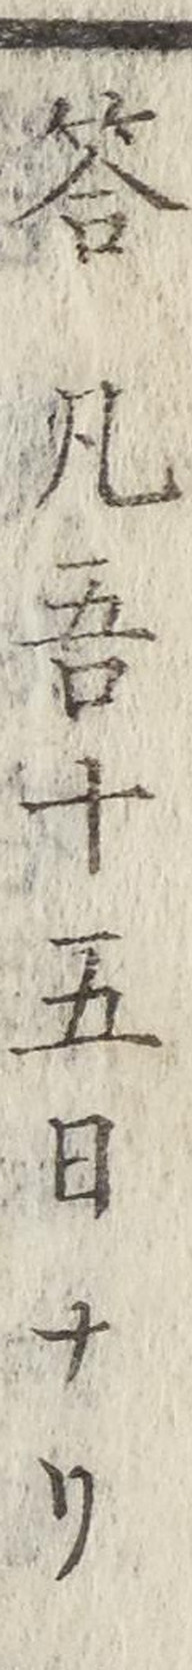答凡吾十五日ナリ
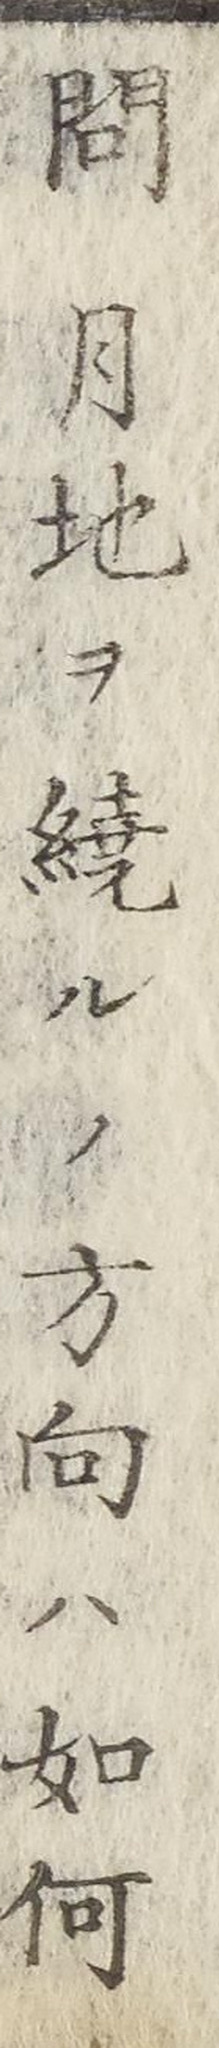問月地ヲ繞ルノ方向ハ如何
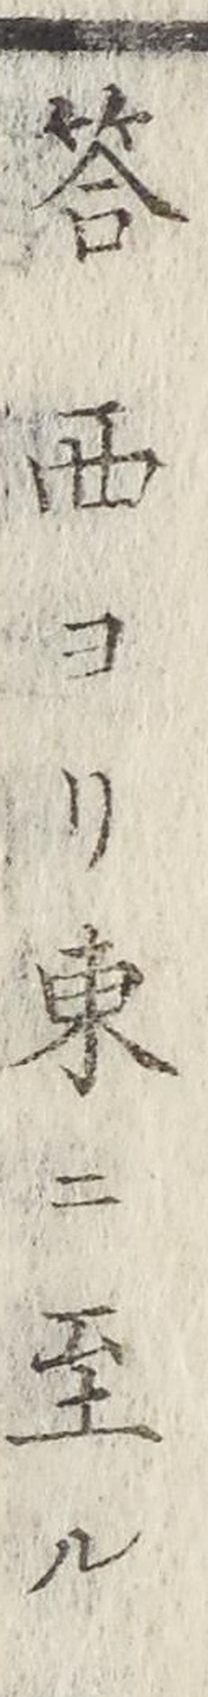答西ヨリ東ニ至ル
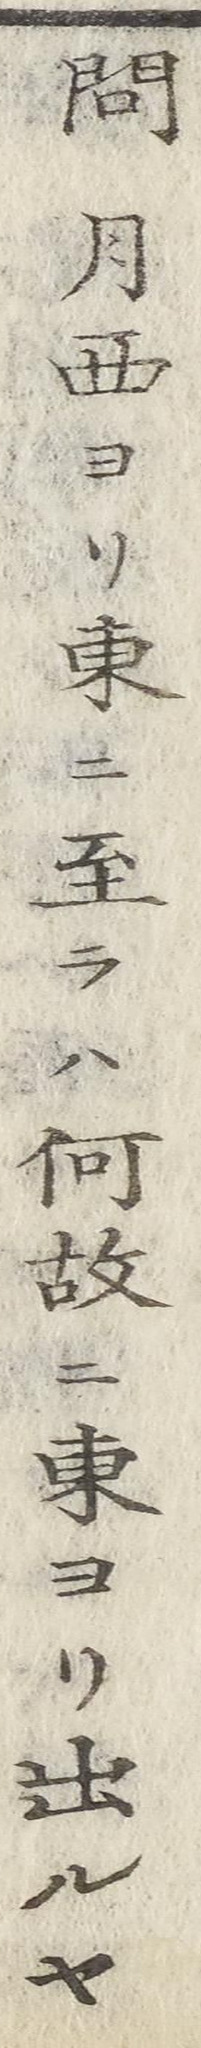問月西ヨリ東ニ至ラハ何故ニ東ヨリ出ルヤ
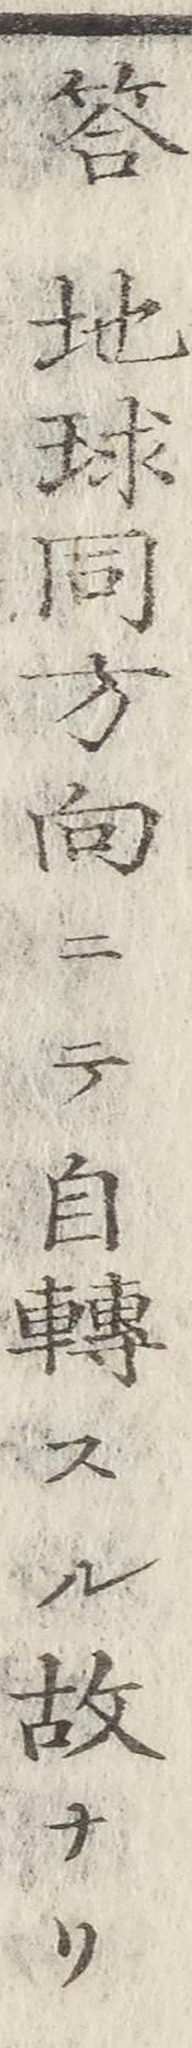答地球同方向ニテ自転スル故ナリ
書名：星学圖説　下
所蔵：東京大学地震研究所図書室 Earthquake Research Institute Library, The University of Tokyo, JAPAN
